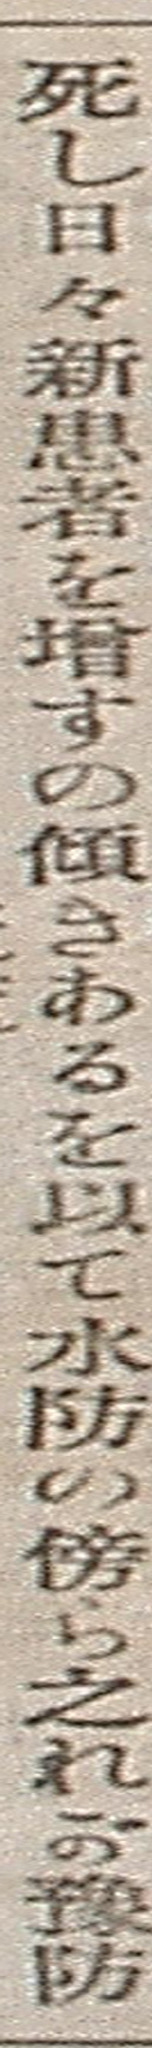死し日々新患者を増すの傾きあるを以て水防の傍ら之れが予防
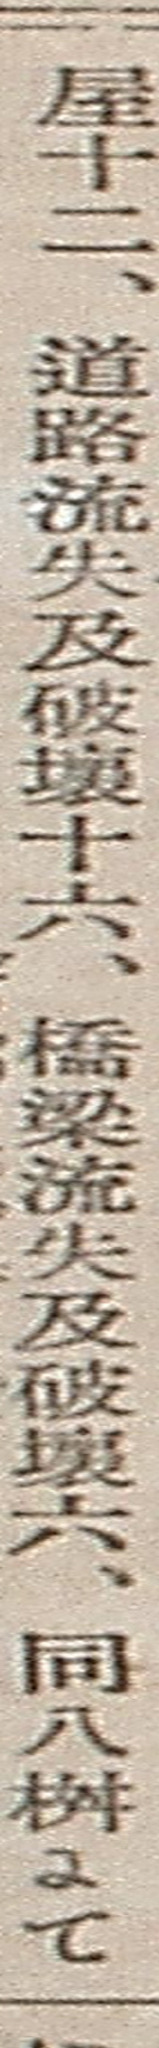屋十二、道路流失及破壊十六、橋梁流失及破壊六、同八桝にて
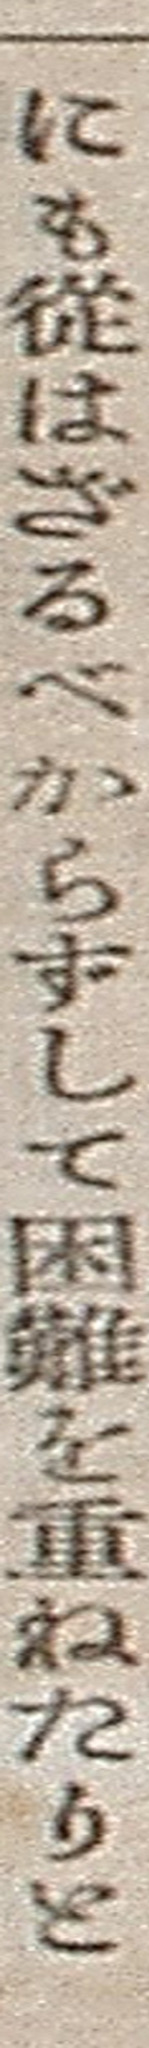にも従はざるべからずして困難を重ねたりと
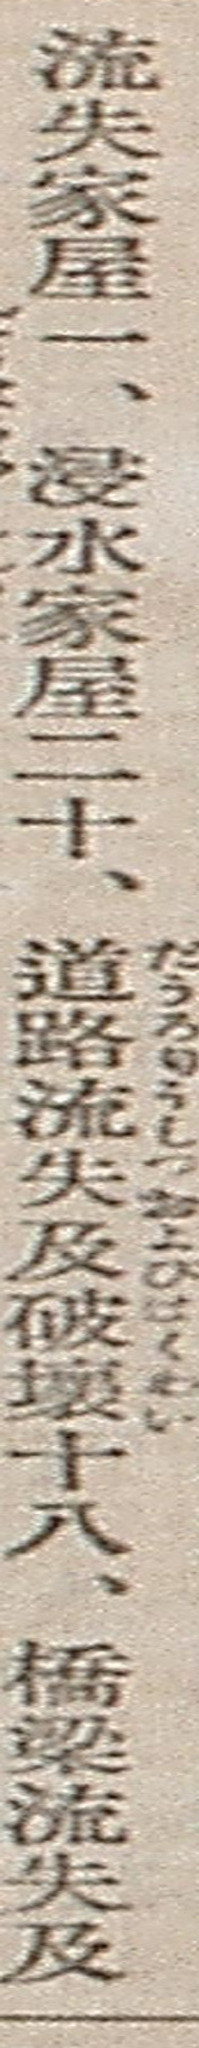流失家屋一、浸水家屋二十、道路流失及破壊十八、橋梁流失及
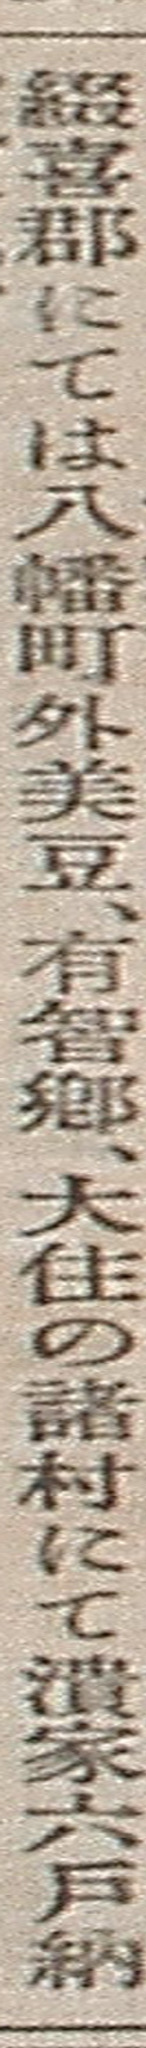綴喜郡にては八幡町外美豆、有智郷、大住の諸村にて潰家六戸納
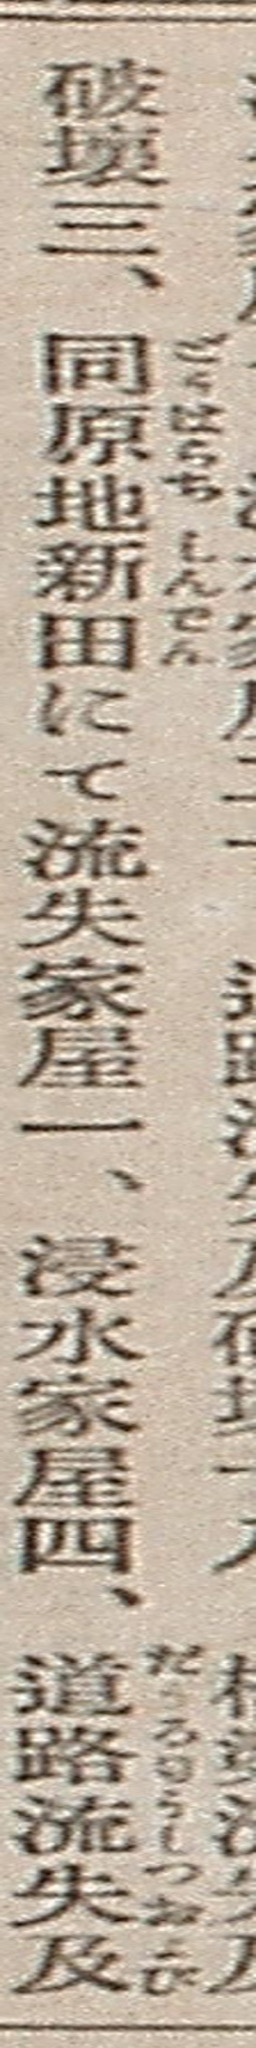破壊三、同原地新田にて流失家屋一、浸水家屋四、道路流失及
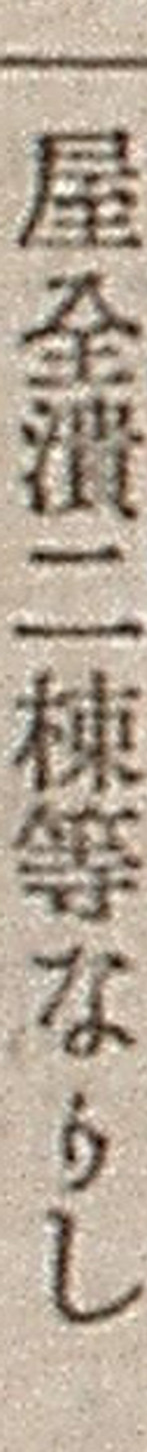屋全潰二棟等なりし

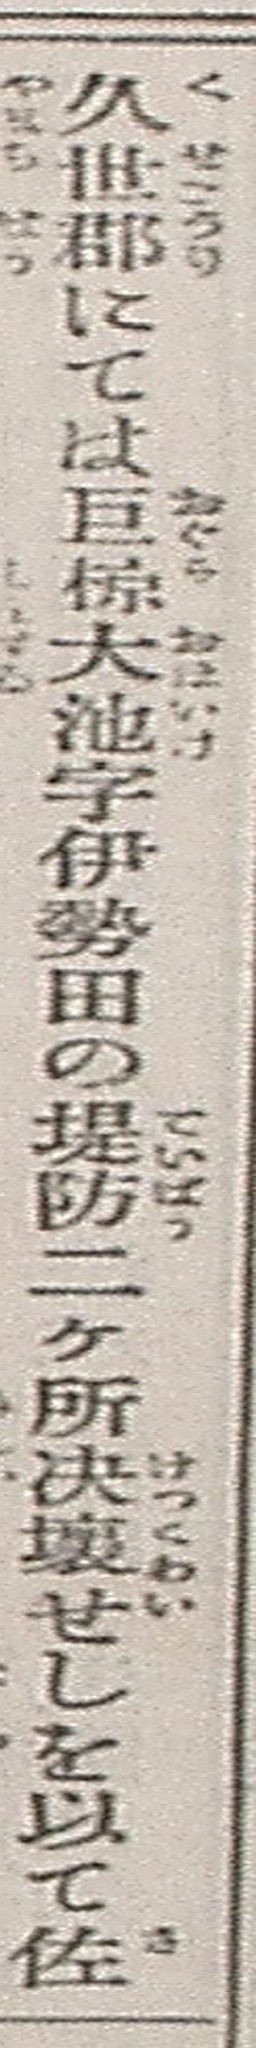久世郡にては巨椋大池字伊勢田の堤防二ヶ所决壊せしを以て佐
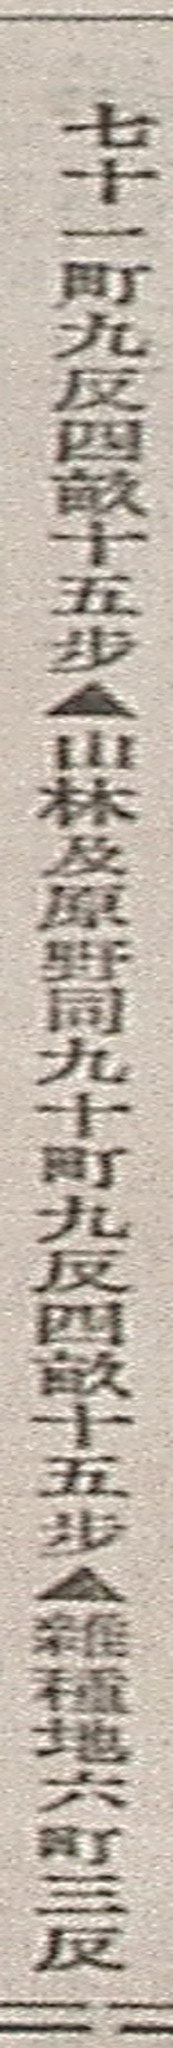七十一町九反四畝十五歩▲山林及原野同九十町九反四畝十五歩▲雑種地六町三反
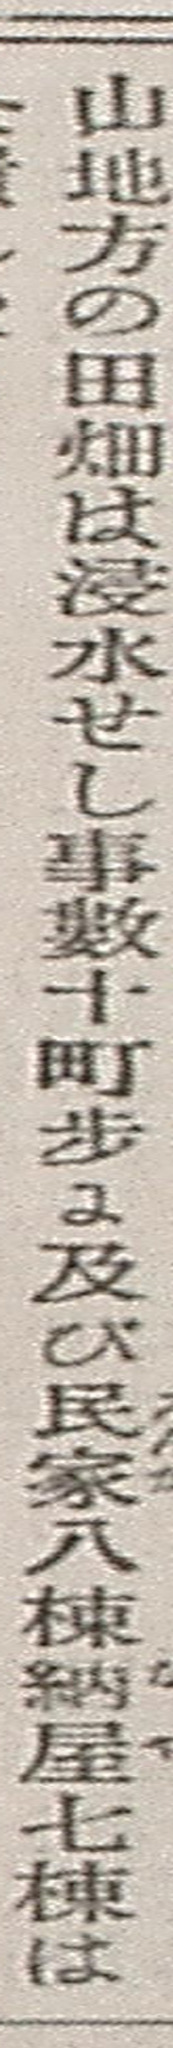山地方の田畑は浸水せし事数十町歩に及び民家八棟納屋七棟は
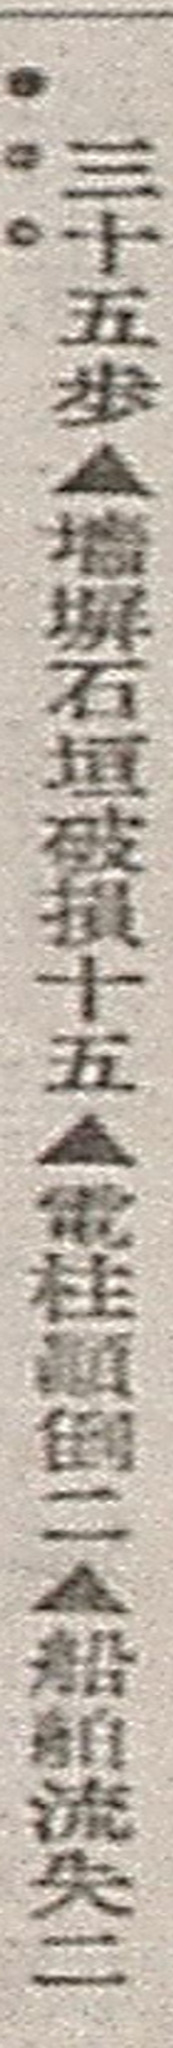三一五歩▲墻塀石垣破損十五▲電柱顚倒二▲船舶流失二
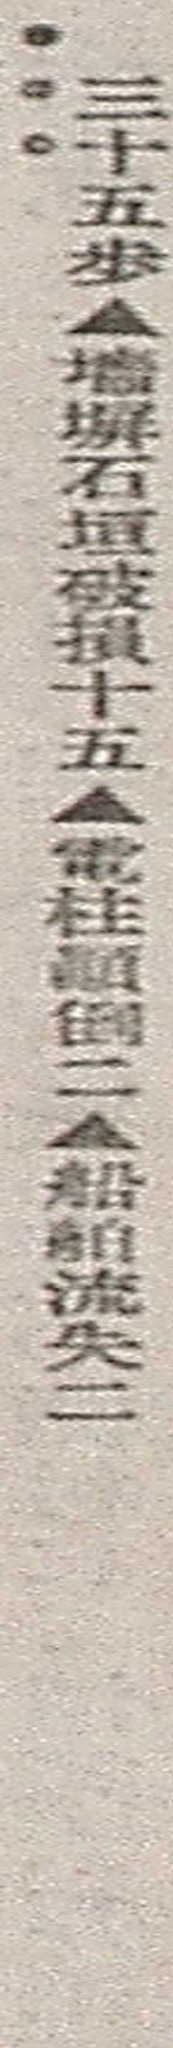三一五歩▲墻塀石垣破損十五▲電柱顚倒二▲船舶流失二
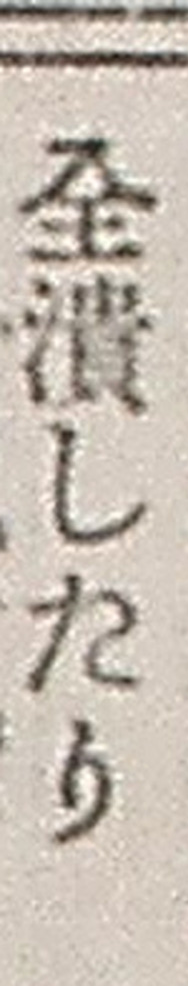全潰したり
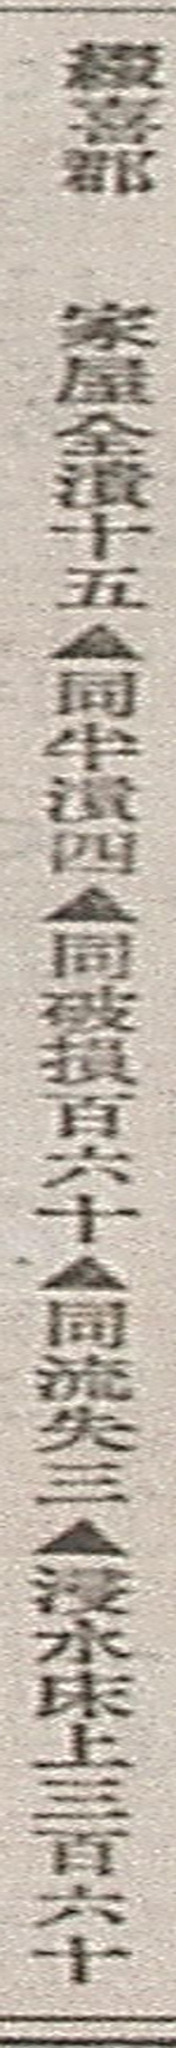綴喜郡家屋全潰十五▲同半潰四▲同破損百六十▲同流失三▲浸水床上三百六十
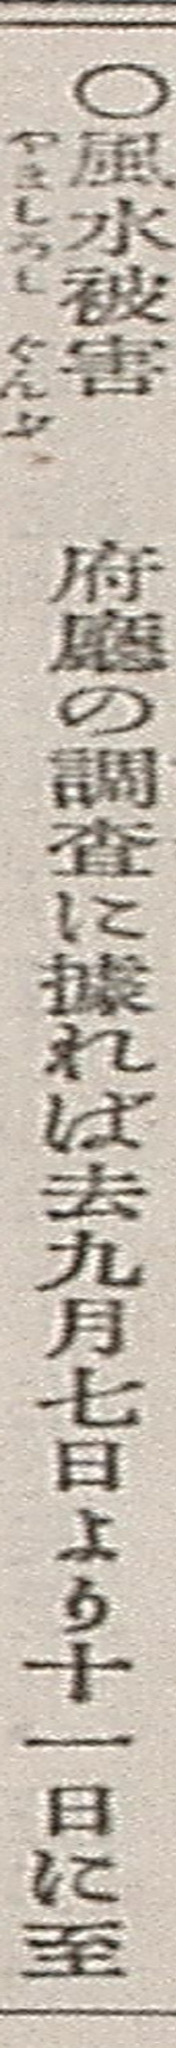◯風水火害府庁の調査に據れば去九月七日より十一日に至
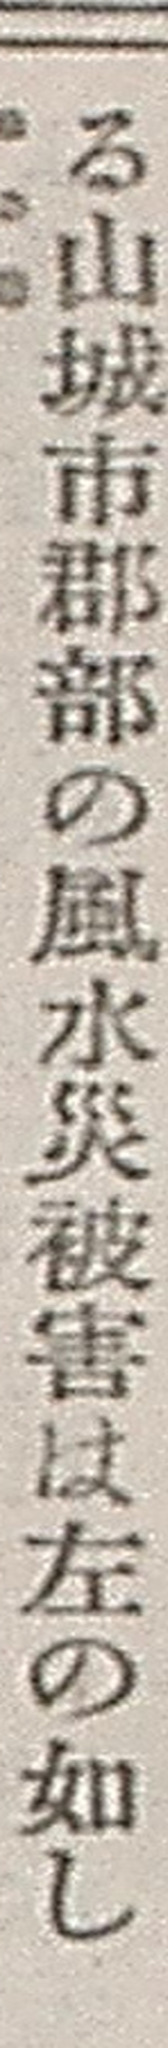る山城市郡部の風水災被害は左の如し
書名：風俗畫報臨時増刊第百二十八號　洪水被害録（下）
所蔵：東京大学地震研究所図書室 Earthquake Research Institute Library, The University of Tokyo, JAPAN
